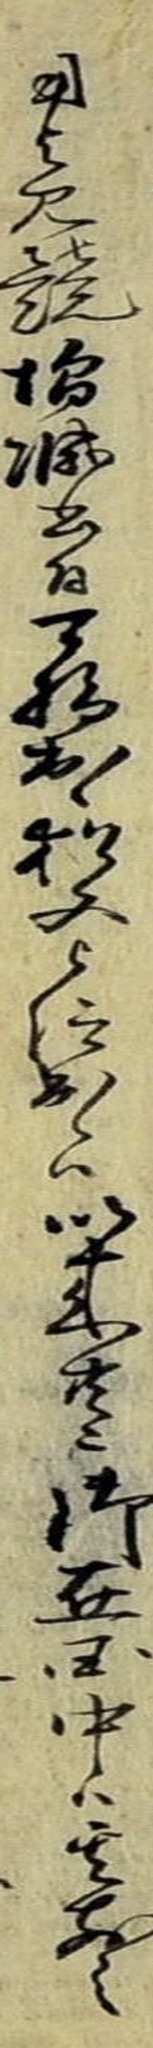用与見競増減書付可指出候猶又被仰出候ハ以来共ニ御在国中ハ其前之
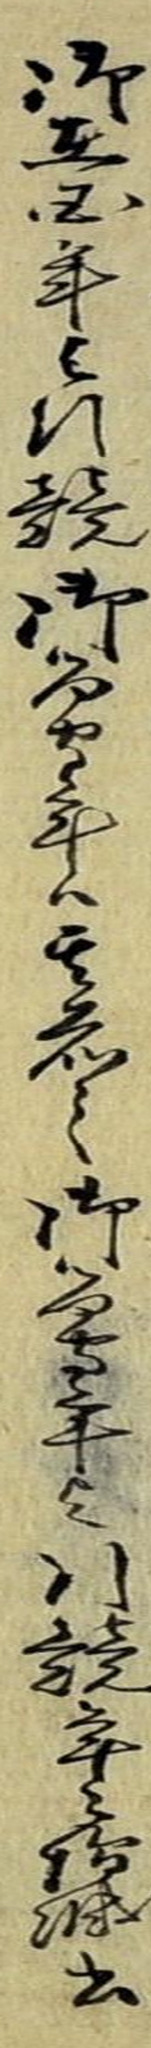御在国年与引競御留守年ハ其前之御留守年与引競年々増減書
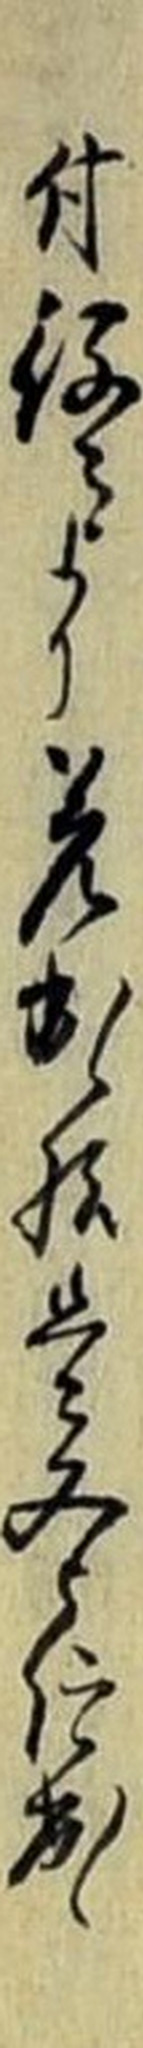付役々より差出候様是又被仰出候
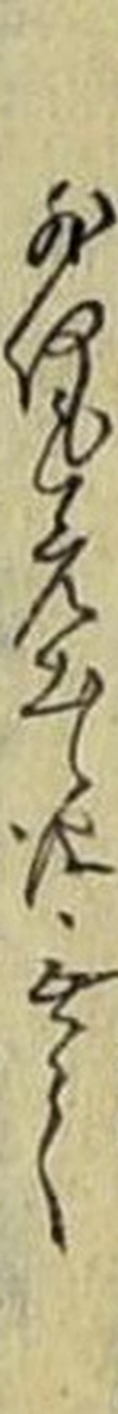外何も差出候儀無之
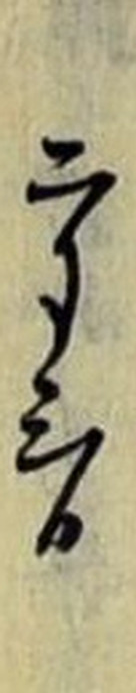二月三日
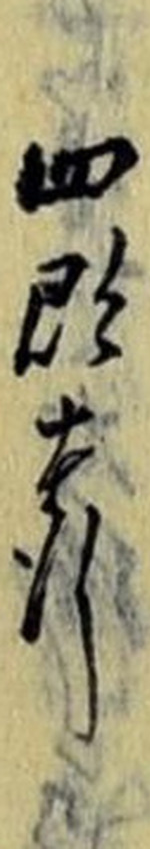四郡奉行
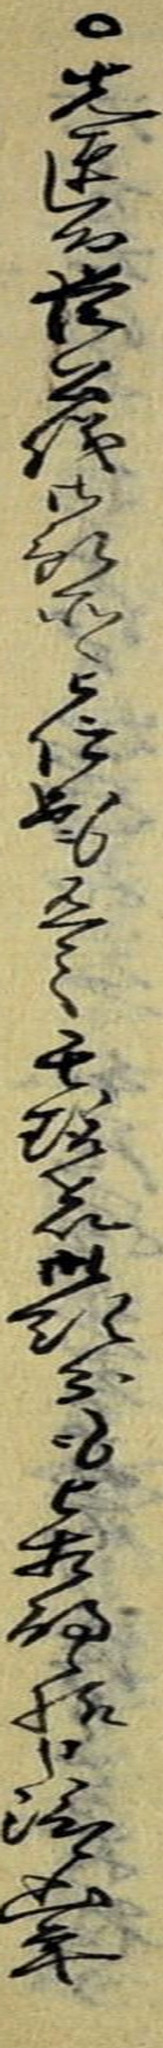〇先達而従公儀御預所へ被仰出も有之其趣を以御領分へも被相触候様申渡候凶年
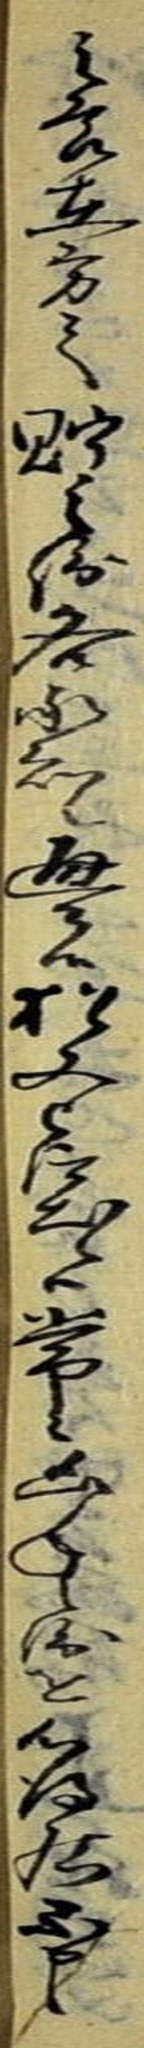之節在方之貯之儀各承知之通ニ候猶又被仰出候ハ常々凶年之儀を心得居不申
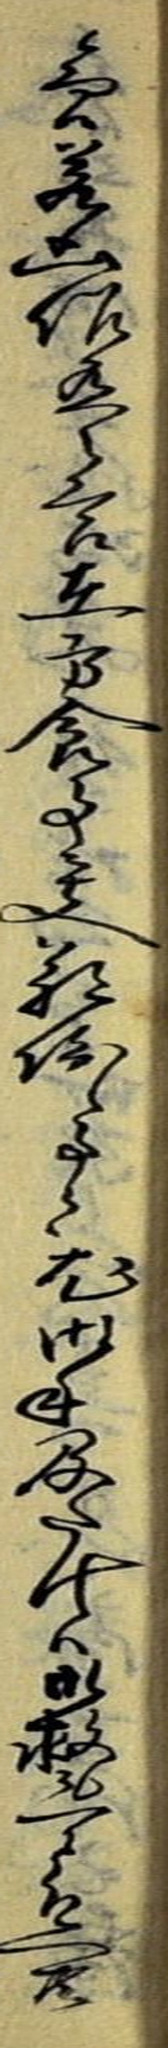ニ而ハ若凶作有之節在方食事ニ支難儀候事ニ候尤御手及たけハ御救も可被下候へ共
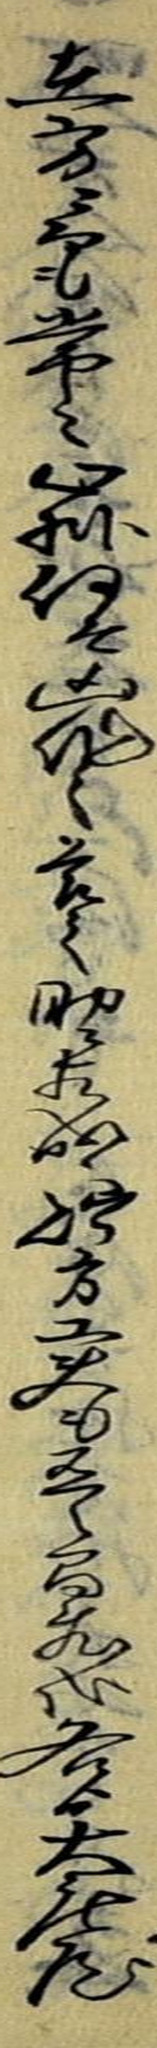在方ニ而も常々心掛何そ凶作之節之助ニ相成候貯方工夫も有之間敷哉各ゟ大庄屋
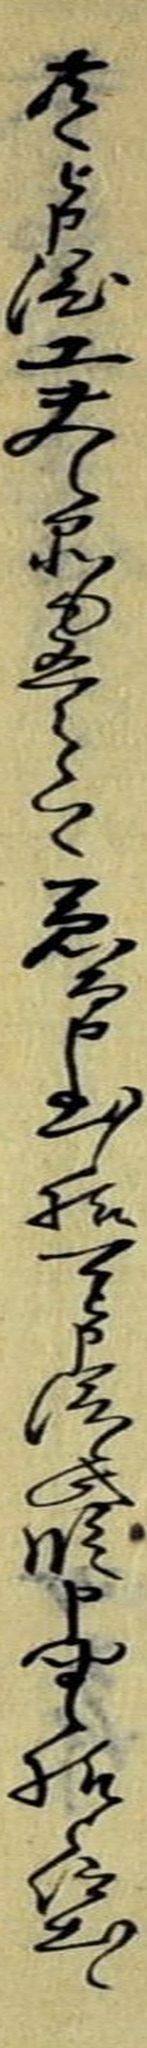共へ被申渡工夫之品も有之候ハヽ兼而申出候様可被申渡候此段申聞候様被仰出候
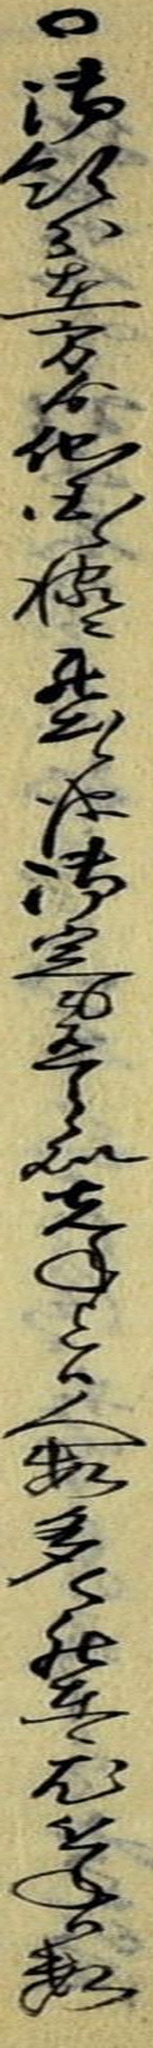〇御領分在方ゟ他国へ稼ニ罷出候儀御定も有之候処先年迄ハ人数多く罷在候尤近年ハ数
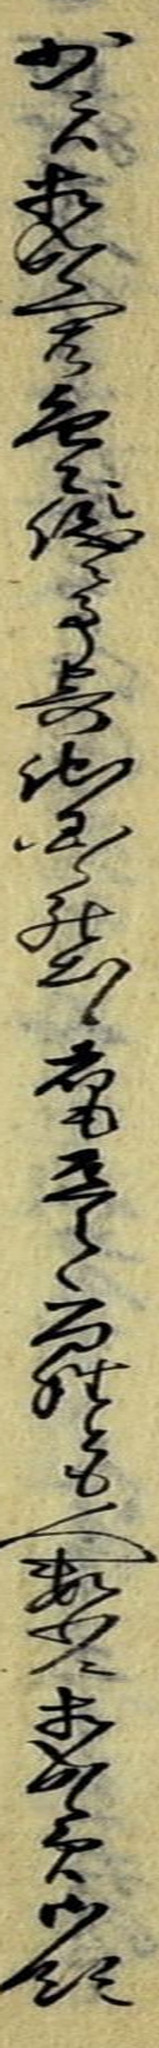少ニハ相成候へ共色々之儀ニ事寄他国へ罷出候者も有之候百姓とも人数少ニ相成候而ハ御領
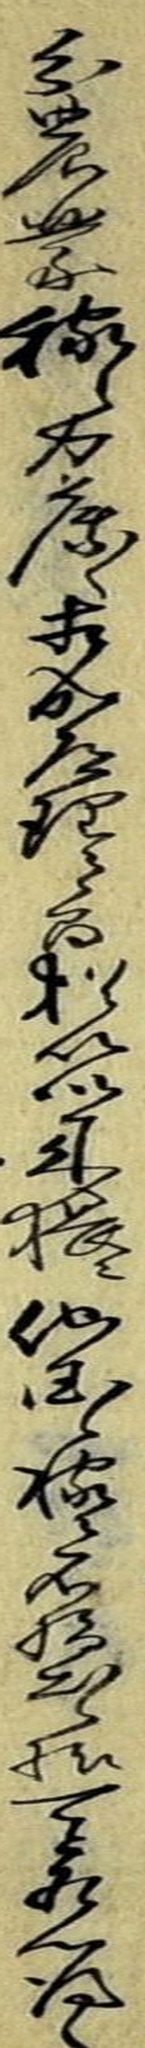分農業稼之力薄く相成道理ニ候間猶以以来猥ニ他国へ稼ニ不指出候様可被相心得候
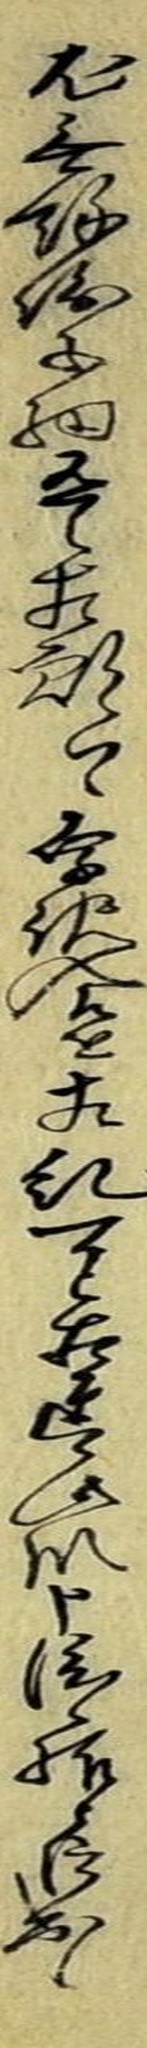尤無余儀子細有之相願候ハヽ厚訳合を相糺可被相達候此段申渡候様被仰出候
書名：命令之部 三
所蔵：福井県文書館 Fukui Prefectural Archives
